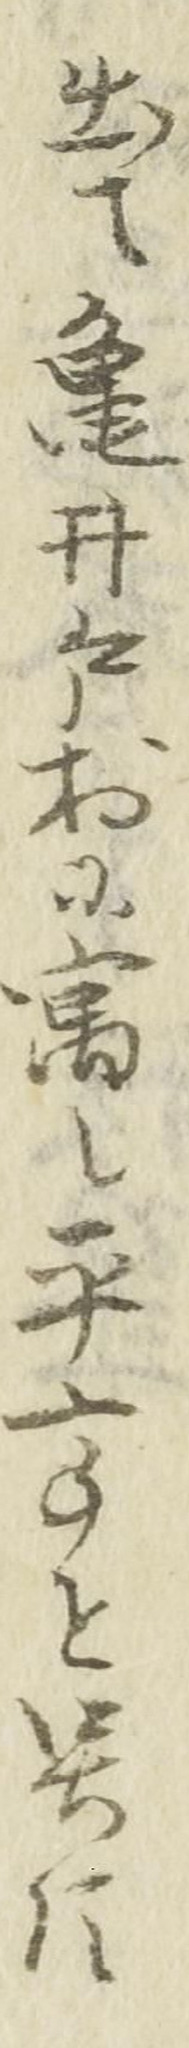出て亀井戸村に寓し平亭と号す
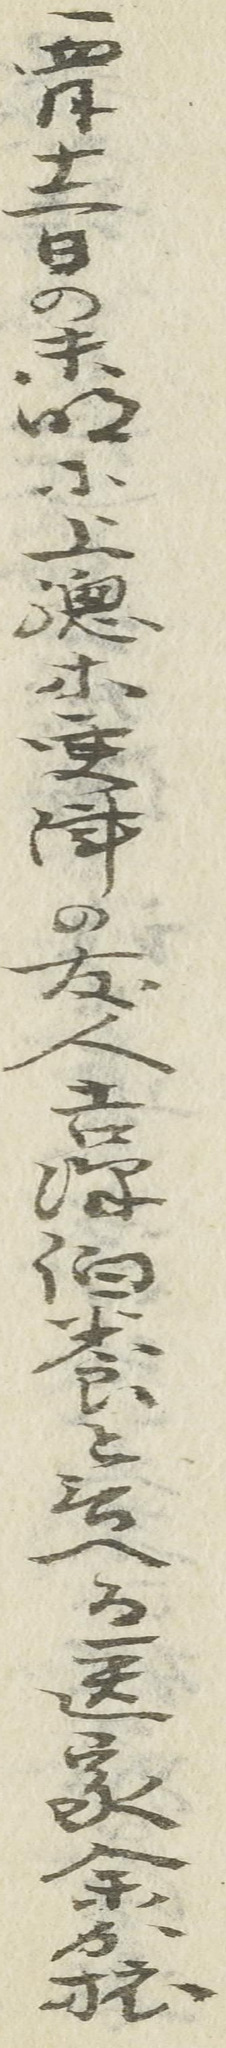一四月十二日の未明に上総木更津の友人吉澤伯養と云へる医家余か旅
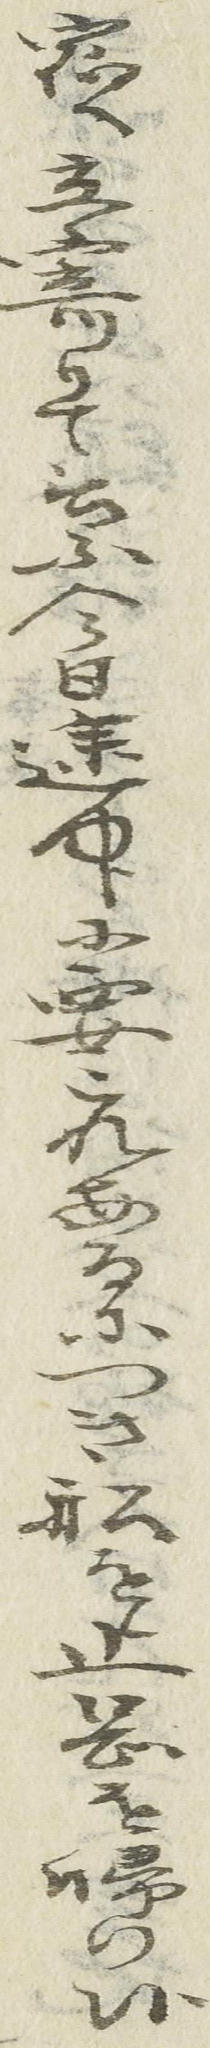宿へ立寄りて云ふ今日途中に要これあるにつき舩を止岡を帰り候
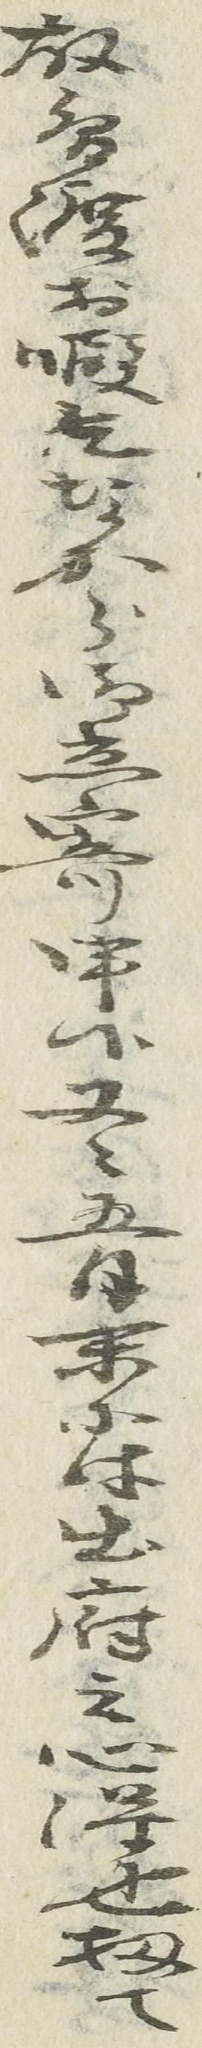故鳥渡お暇乞なから御立寄申候又々五月末には出府之心深也扨て
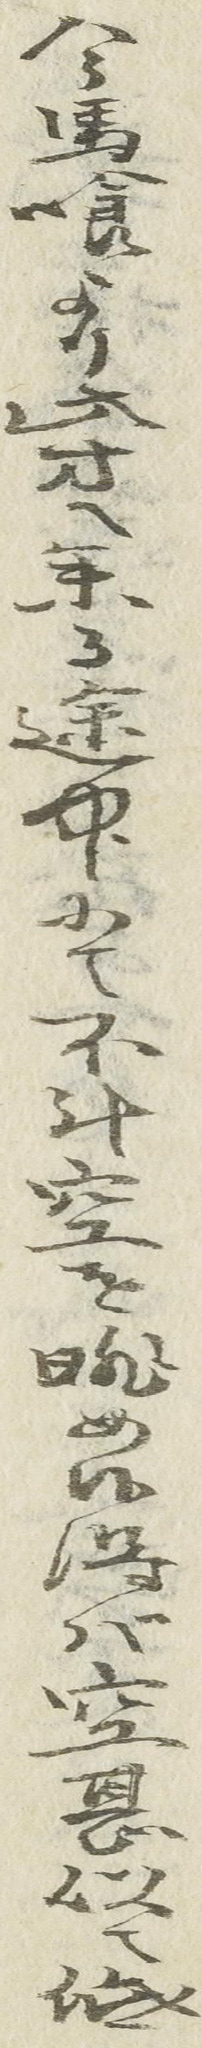今馬喰より此方へ来る途中にて不斗空を眺め候得ば空甚以て低
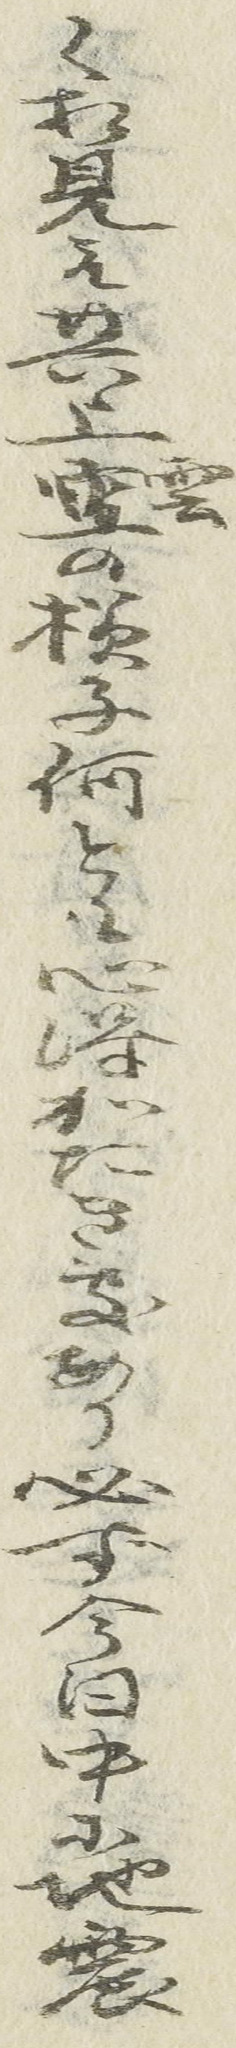く相見え其上空の様子何とも心得かたき處あり必ず今日中に地震
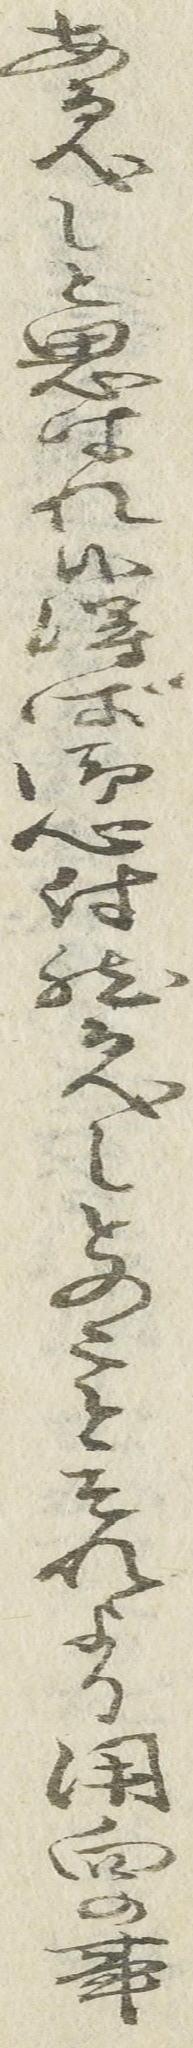あるべしと思はれ候えば御心付然るべしとのことそれより用向の事
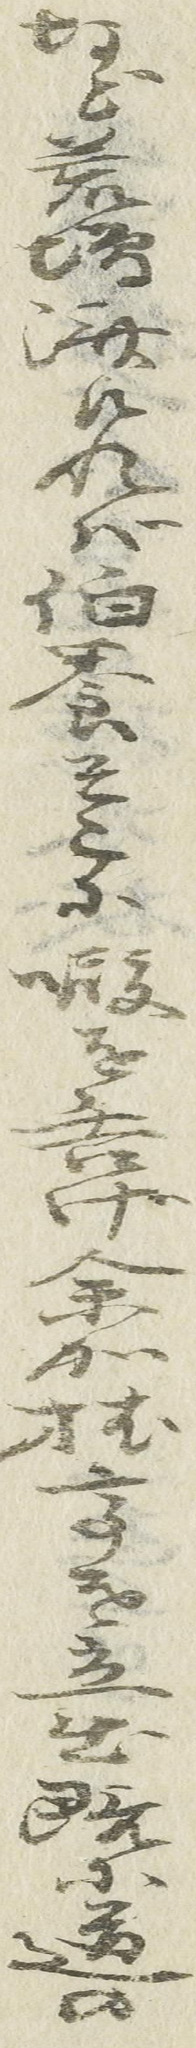など荒増済ければ伯養そこに暇を告げ余が枕？亭を立出既に道の
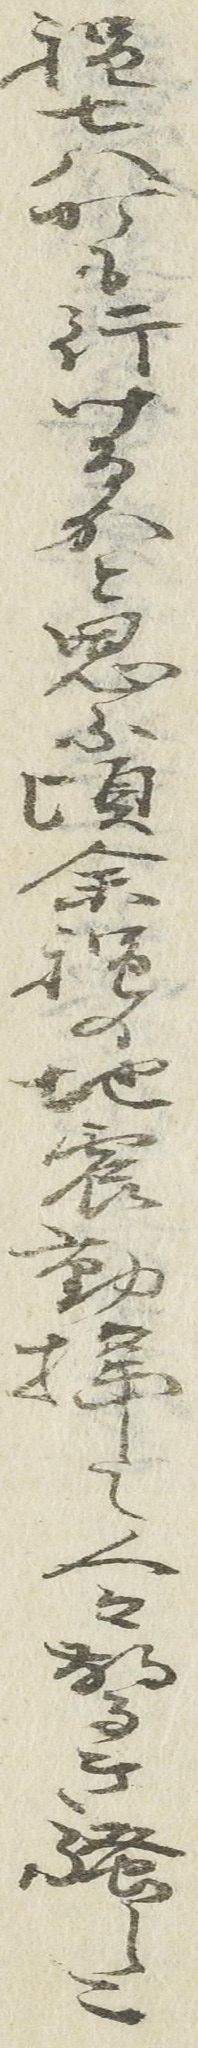程七八町も行けるかと思ふ頃余程の地震動揺して人々驚き騒しこ
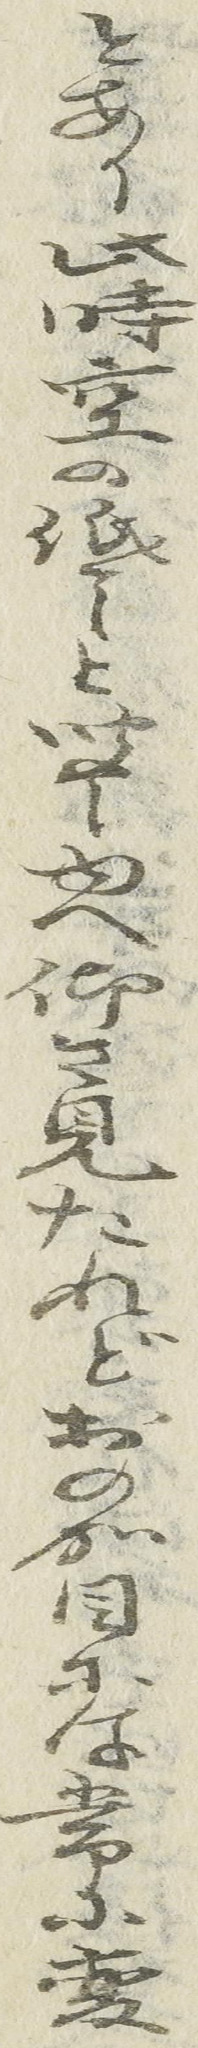とあり此時空の低しと聞しゆへ仰き見たれどおのが目には常に変
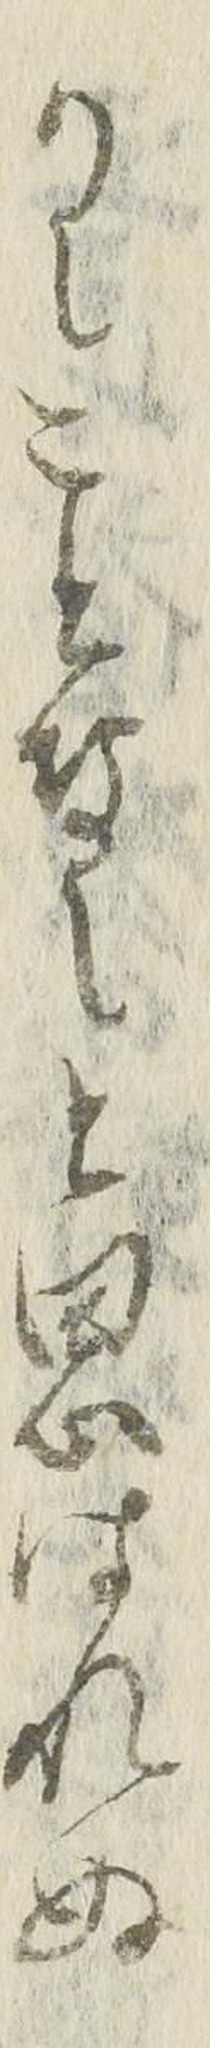りしことなしと思はれぬ
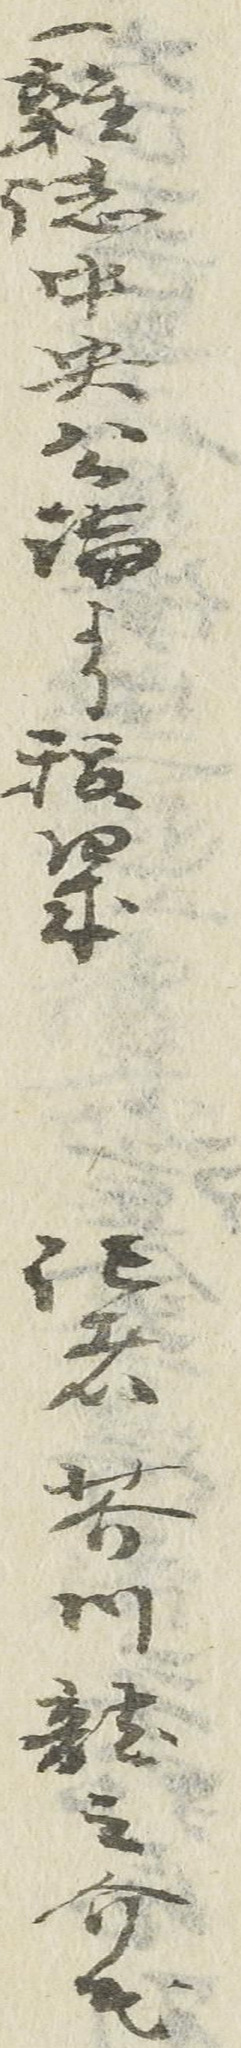（雑誌中央公論より秡翠記者芥川龍之介氏

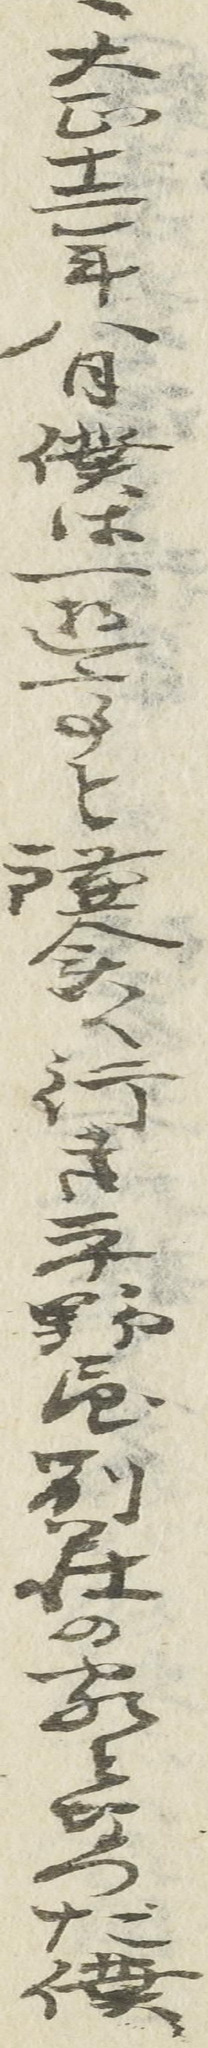一大正十二年八月僕は一遊亭と鎌倉へ行き平野屋別荘の客となつた僕
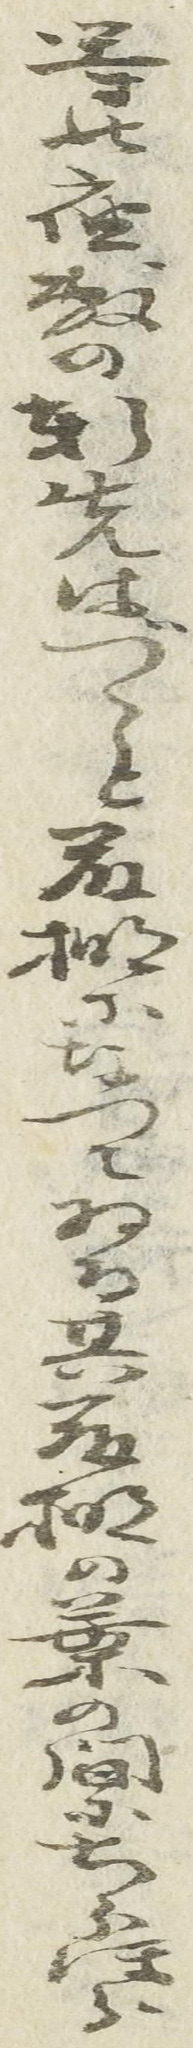等の座敷の軒先はづゝと藤棚になつてゐる其藤棚の葉の間にちらほら
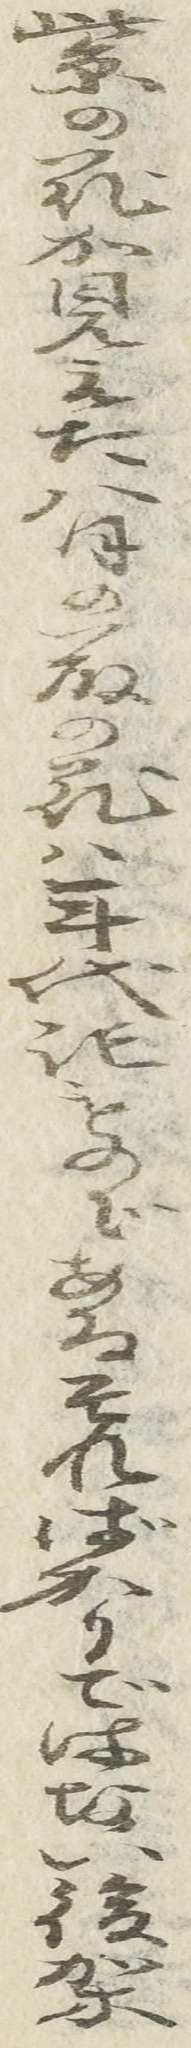紫の花が見えた八月の藤の花は年代記ものであるそればかりではない後架
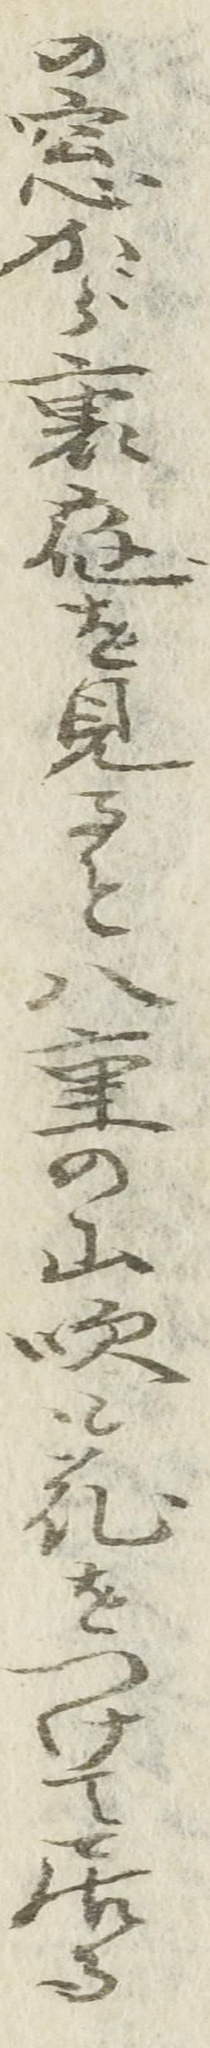の窓から裏庭を見ると八重の山吹も花をつけて居る
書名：地震前兆集　全
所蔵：東京大学地震研究所図書室 Earthquake Research Institute Library, The University of Tokyo, JAPAN
